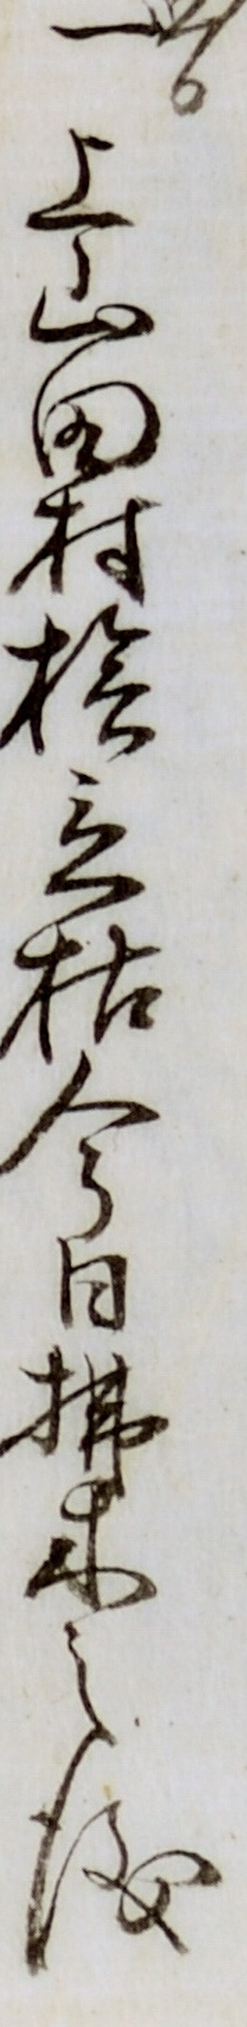一上山田村桧立枯今日払木之儀
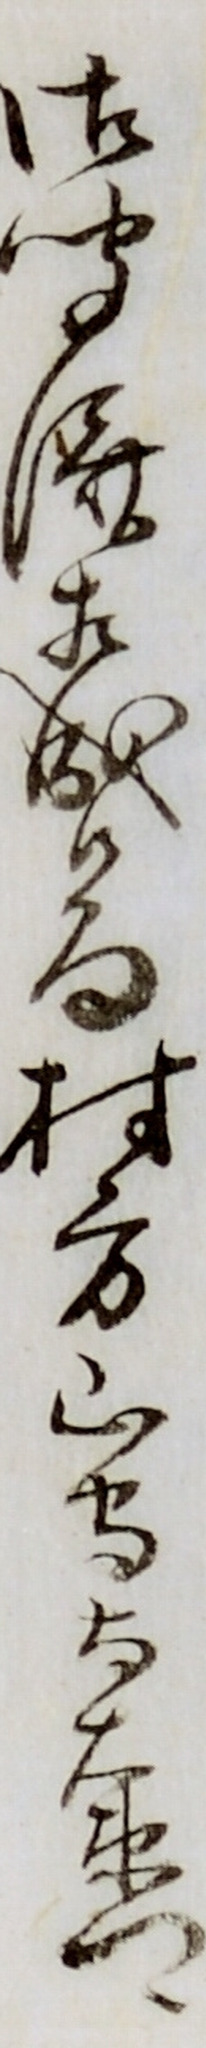御聞済相成候間村方山守与右衛門へ
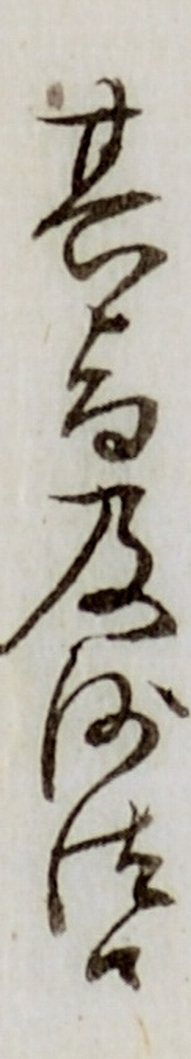其旨及沙汰候
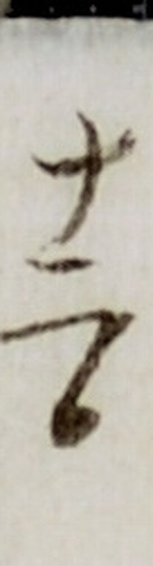十二日
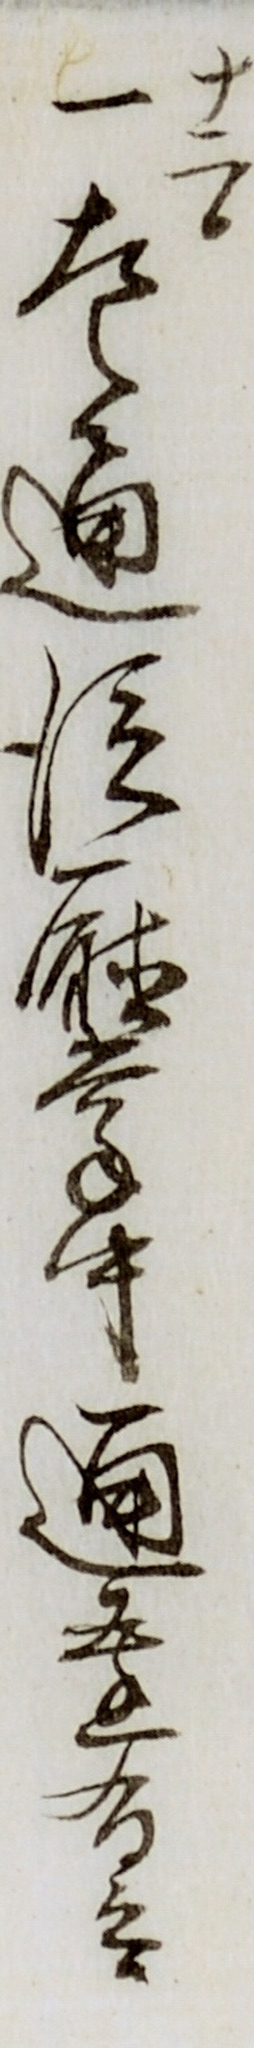一左之通従庁掌中通達有之候
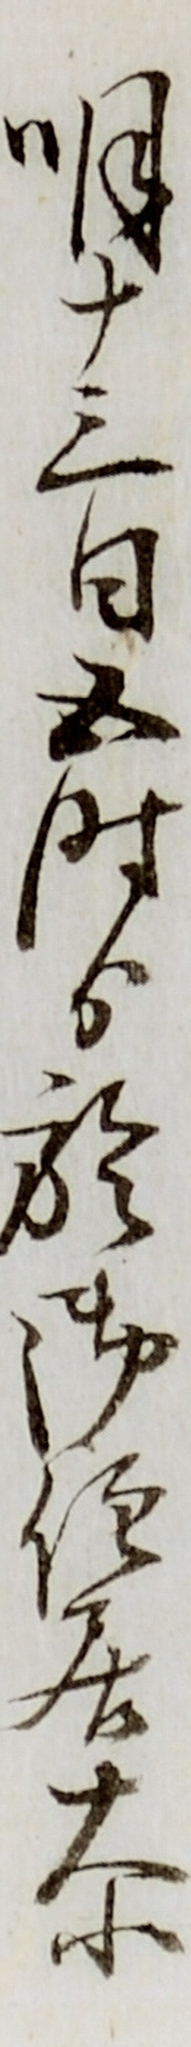明十三日五時ゟ於御住居大小
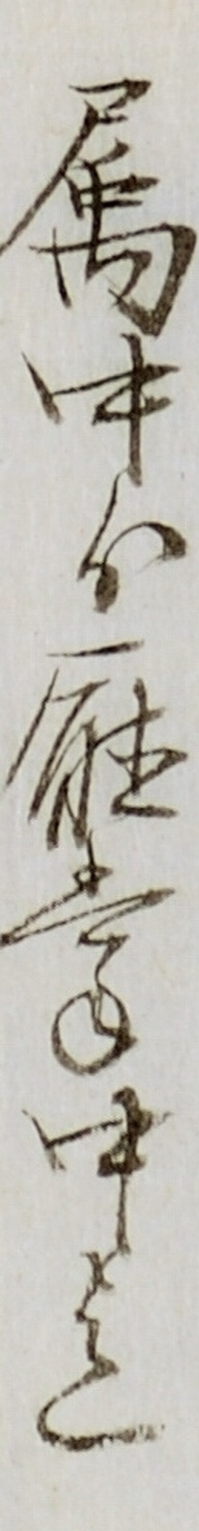属中ゟ庁掌中迄
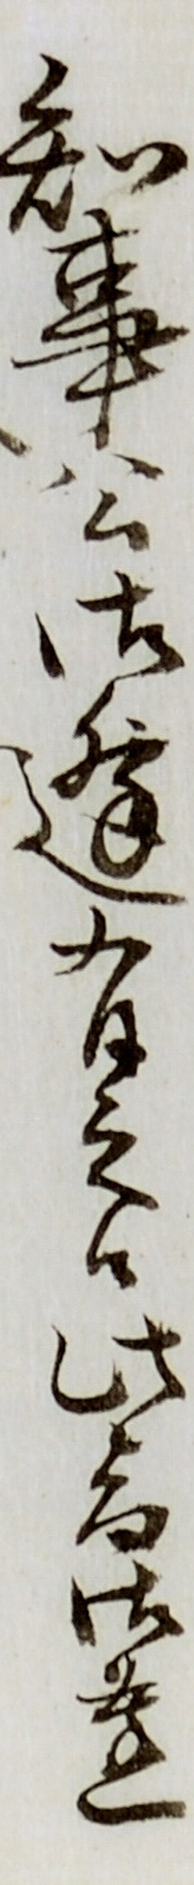知事公御逢有之候此旨御達
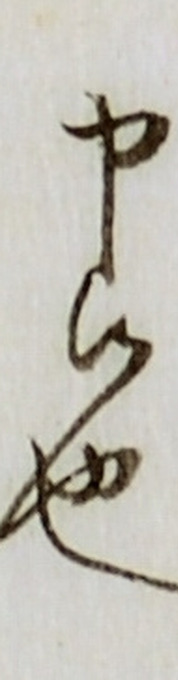申候也
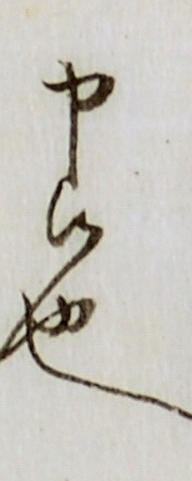申候也
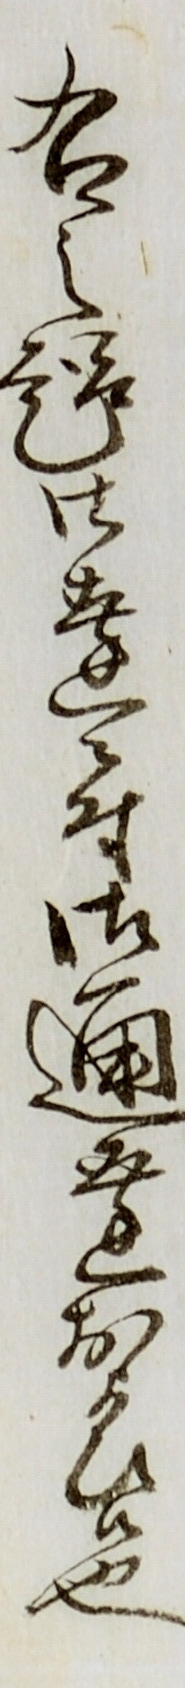右之趣御達に付御通達およひ候也
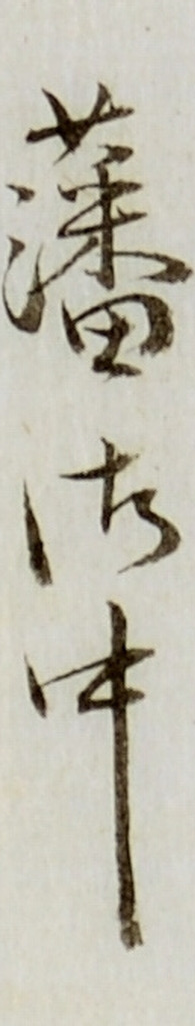藩御中
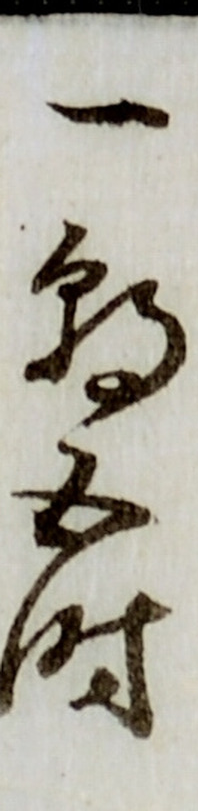一麻五時
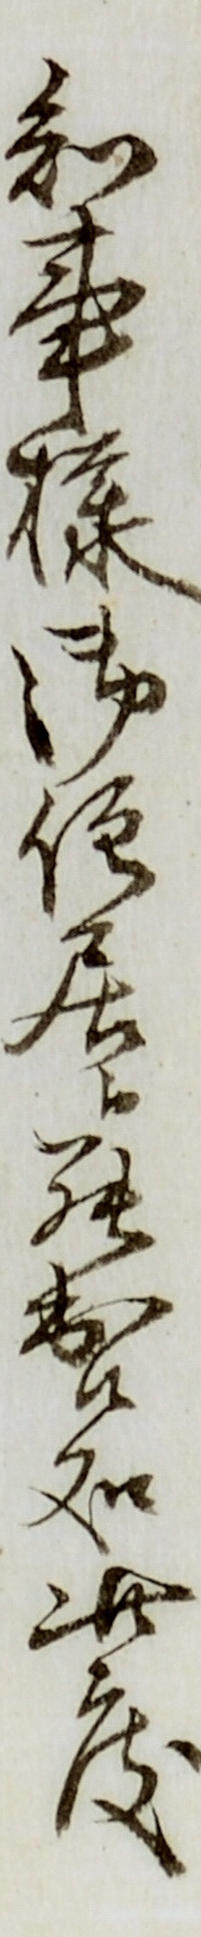知事様御住居え罷出候処此度
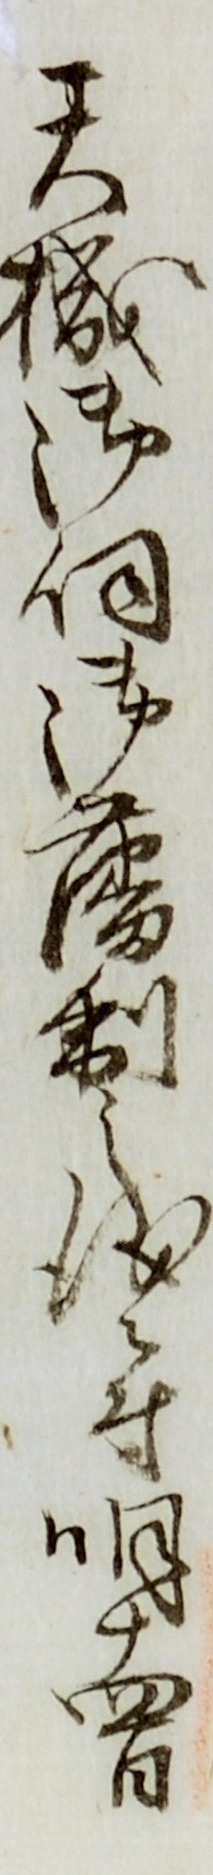天機御伺御藩制之儀に付明十四日
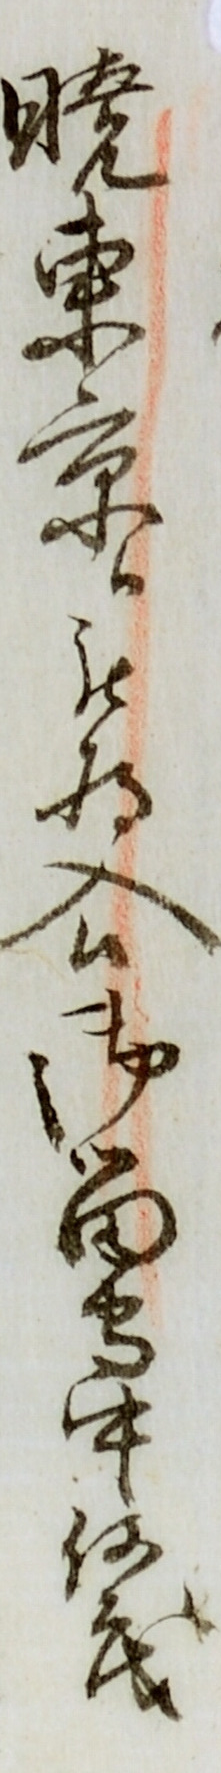暁東京え被為入候御留守中何も
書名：山林方諸事御用留
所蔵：伊那市立高遠町図書館・合同会社AMANE
